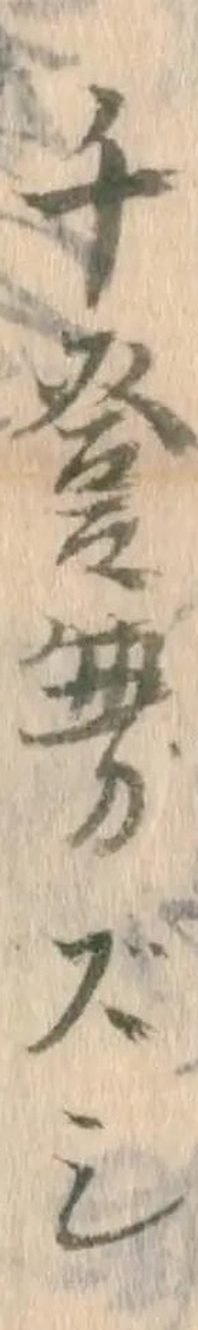千登勢ズシ
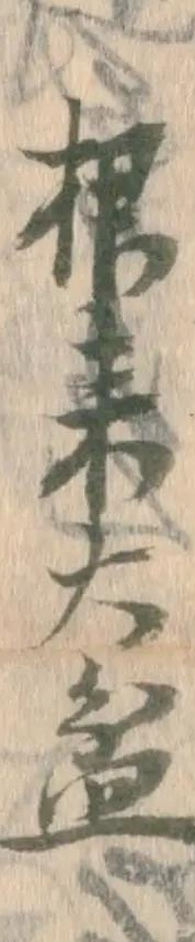根来大盆
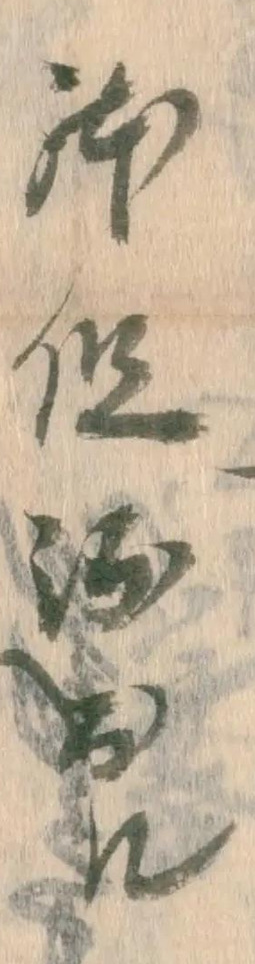鉢但酒出ル
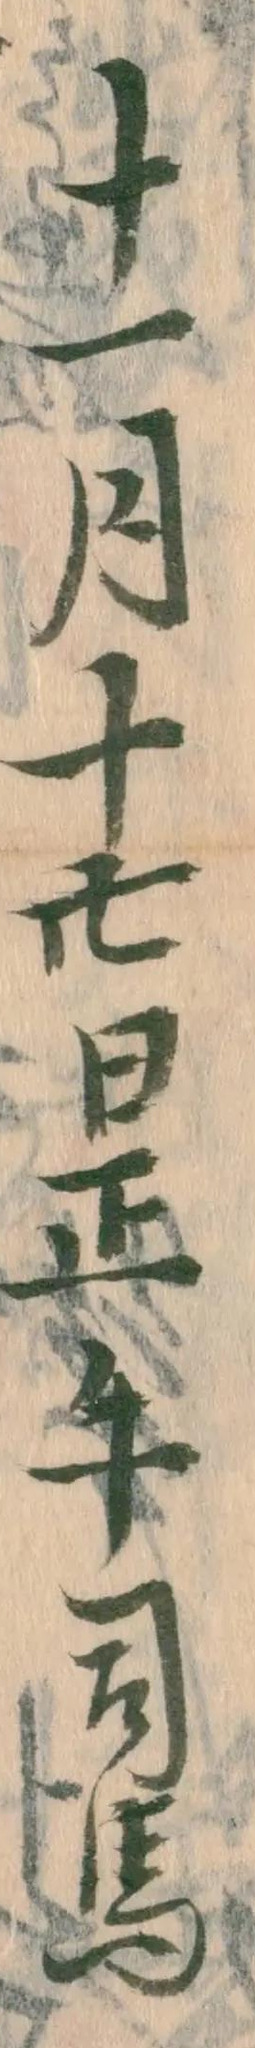十一月十七日正午司馬
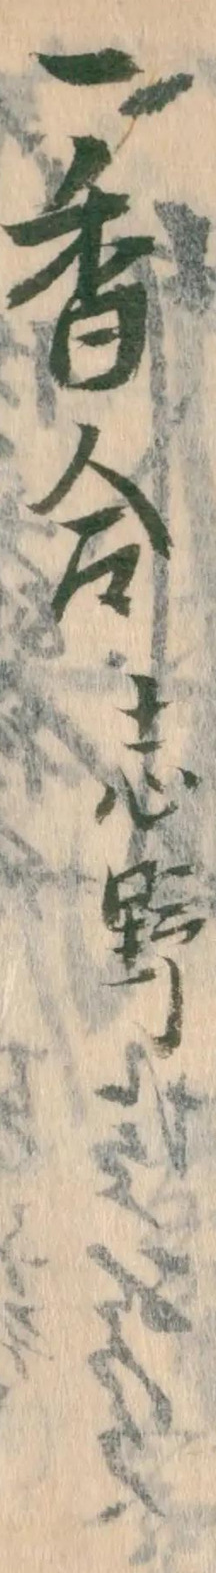一香合志野
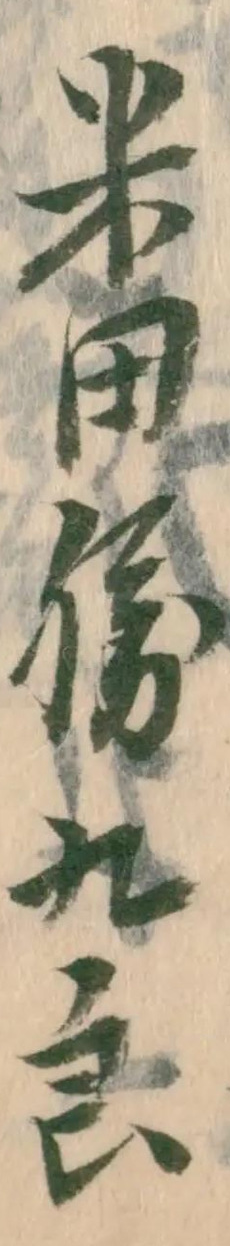米田勝九良
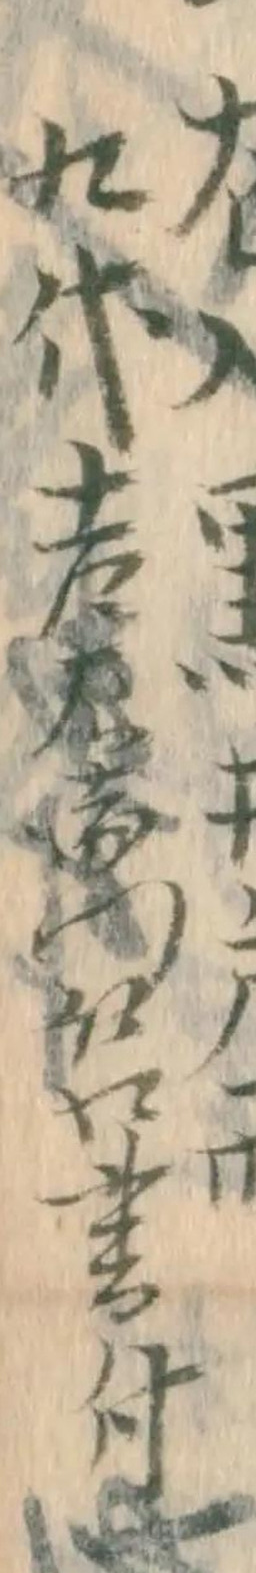九代吉左衛門箱書付

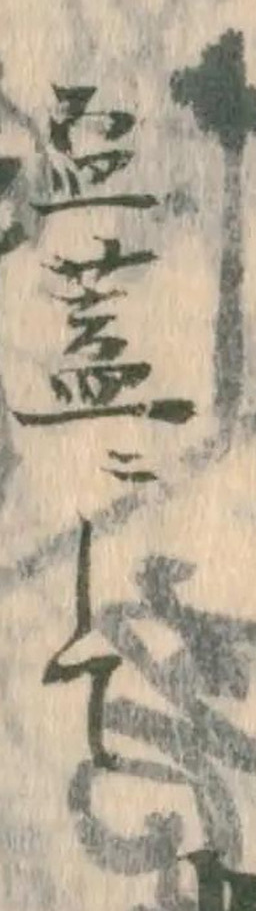盃蓋にして
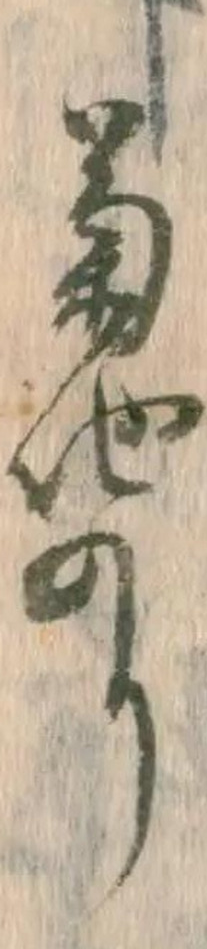菊地のり
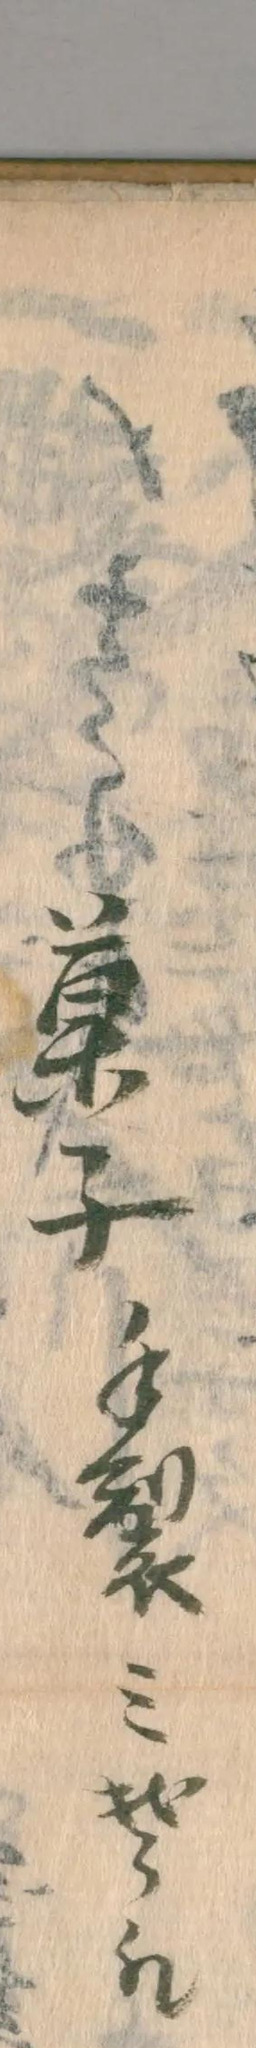菓子手製みそれ
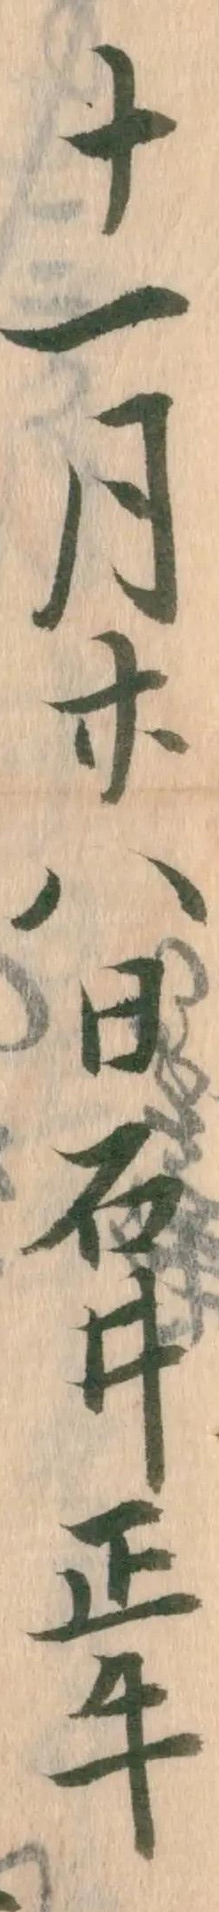十一月廿八日石井正午

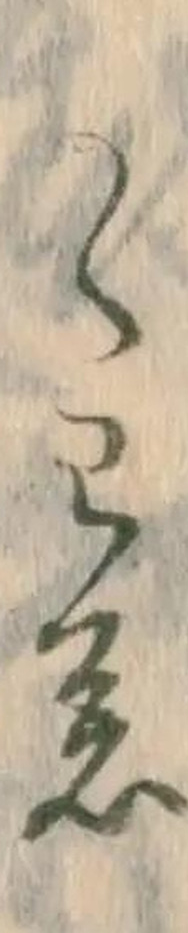くわゑ
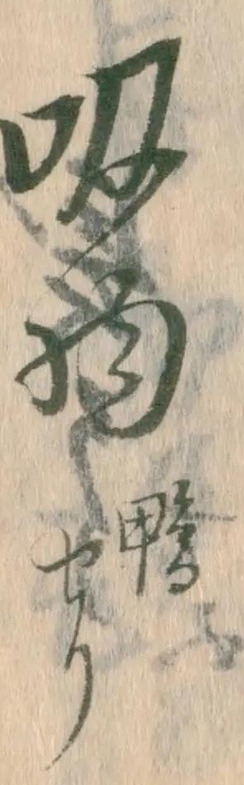吸物鴨
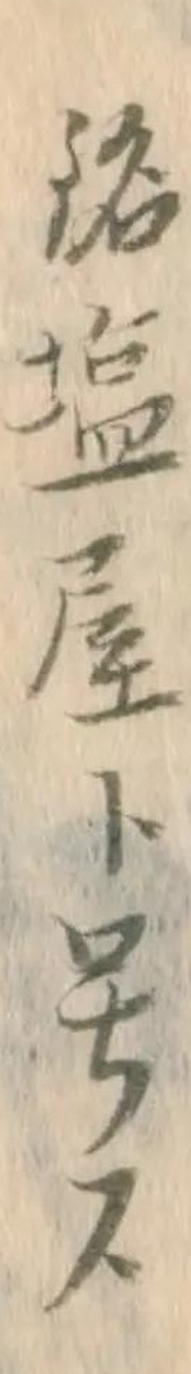洛中塩屋ト号ス
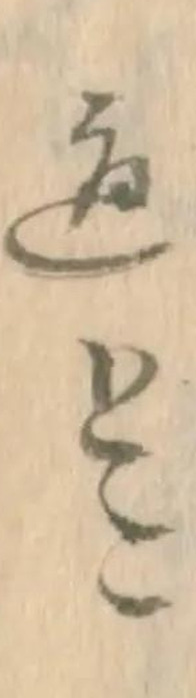庭とこ

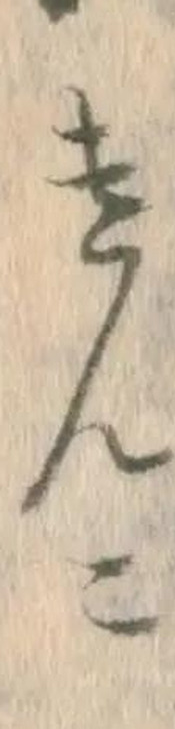きんこ
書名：妙喜庵茶事道具料理扣
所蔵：国立国会図書館 National Diet Library, JAPAN
